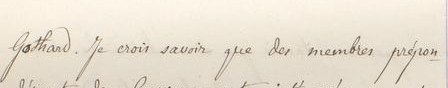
Gothard. Je crois savoir que des membres prépon-
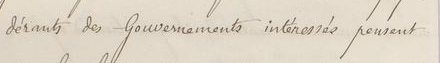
dérants des Gouvernements intéressés pensent
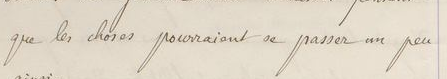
que les choses pourraient se passer un peu
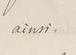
ainsi.
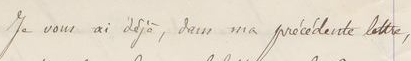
Je vous ai déjà, dans ma précédente lettre,
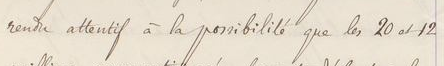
rendu attentif à la possibilité que les 20 et 12
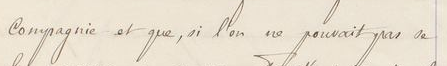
Compagnie et que, si l'on ne pouvait pas se
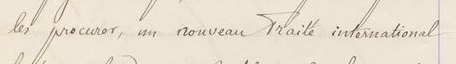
les procurer, un nouveau Traité international
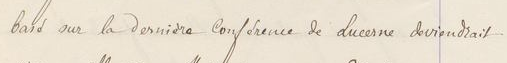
basé sur la dernière Conférence de Lucerne deviendrait
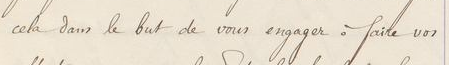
cela dans le but de vous engager à faire vos
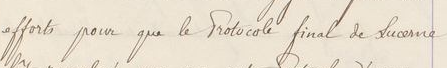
efforts pour que le Protocole final de Lucerne
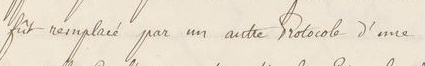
fût remplacé par un autre Protocole d'une
